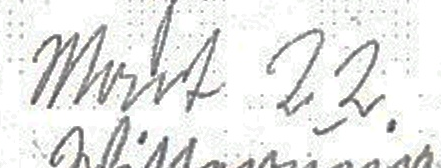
Mont 22
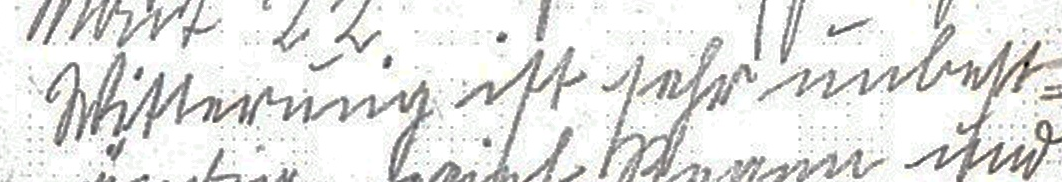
Witterung ist sehr unbest-
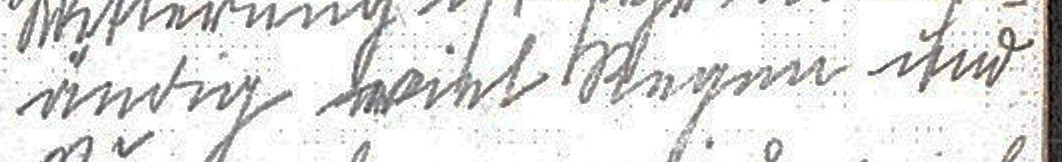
ändig weil Regen und
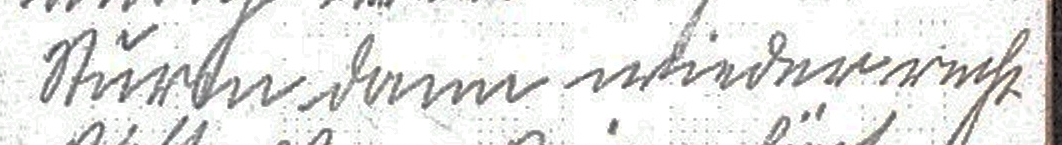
Sturm dann wieder recht
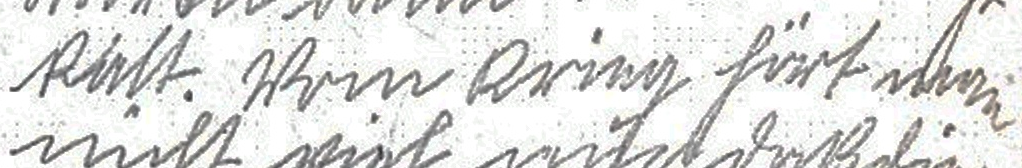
kalt. Vom Krieg hört man
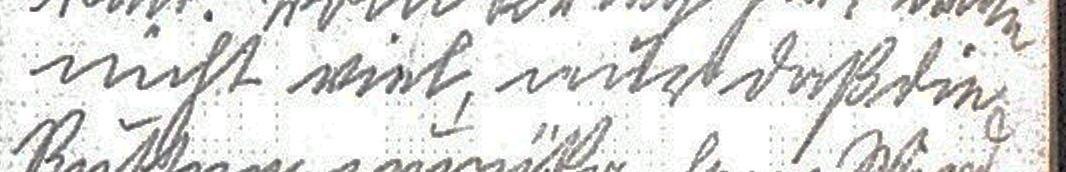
nicht viel, nur daß die
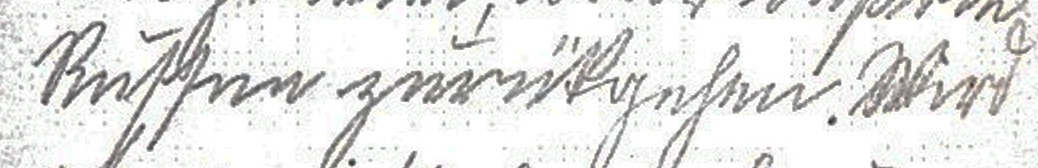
Russen zurückgehen. Wird
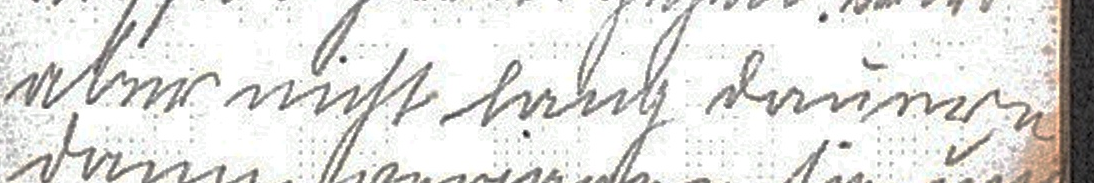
aber nicht lang dauern
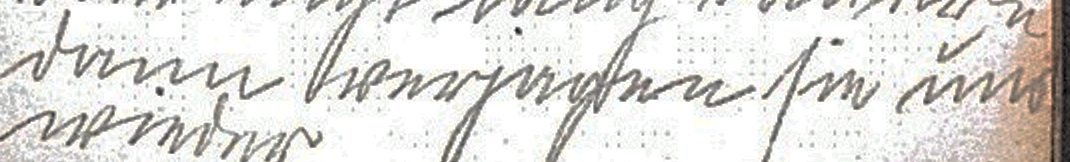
dann verjagen sie uns
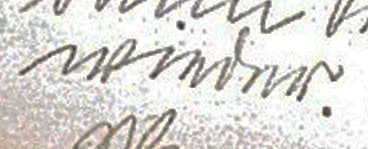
wieder.
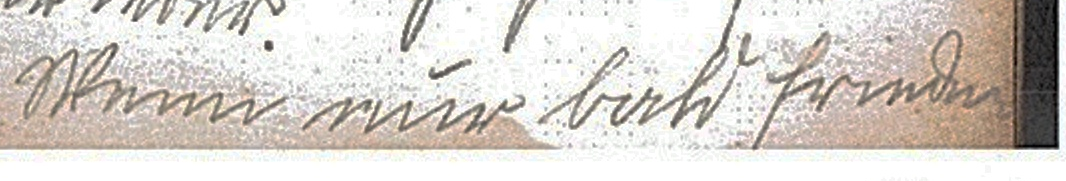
Wenn nur bald Frieden
